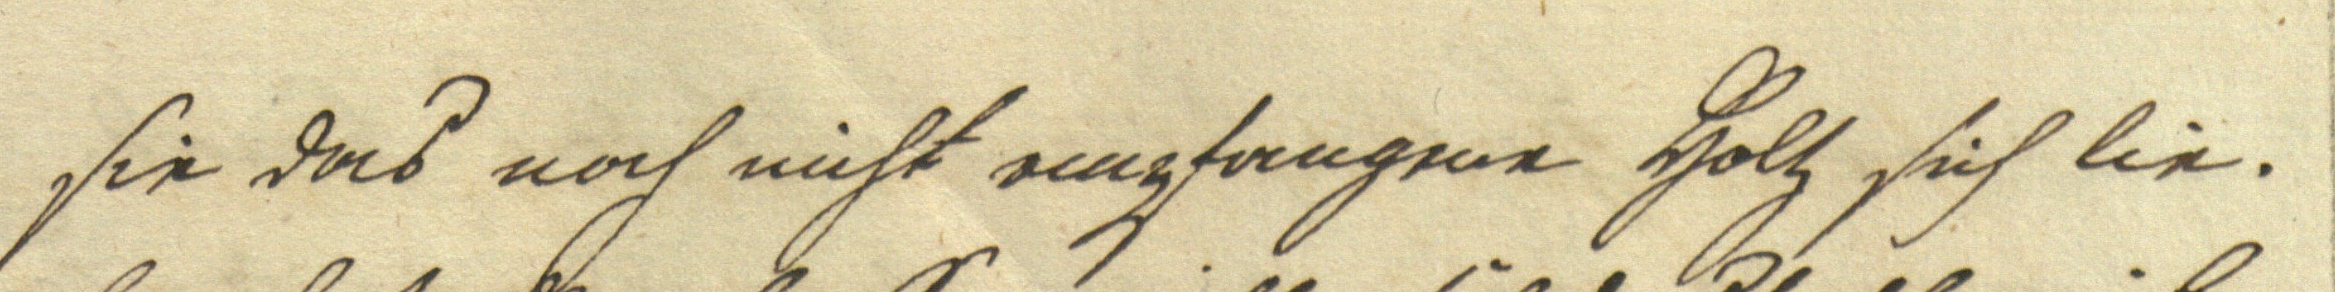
sie das noch nicht empfangene Holz sich lie¬
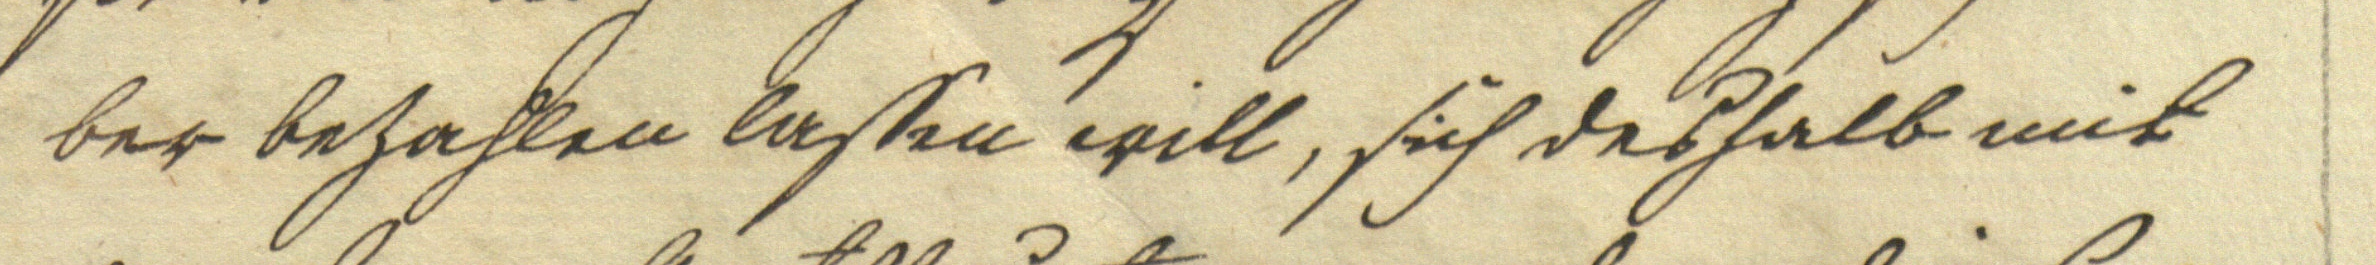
ber bezahlen lassen will, sich deshalb mit
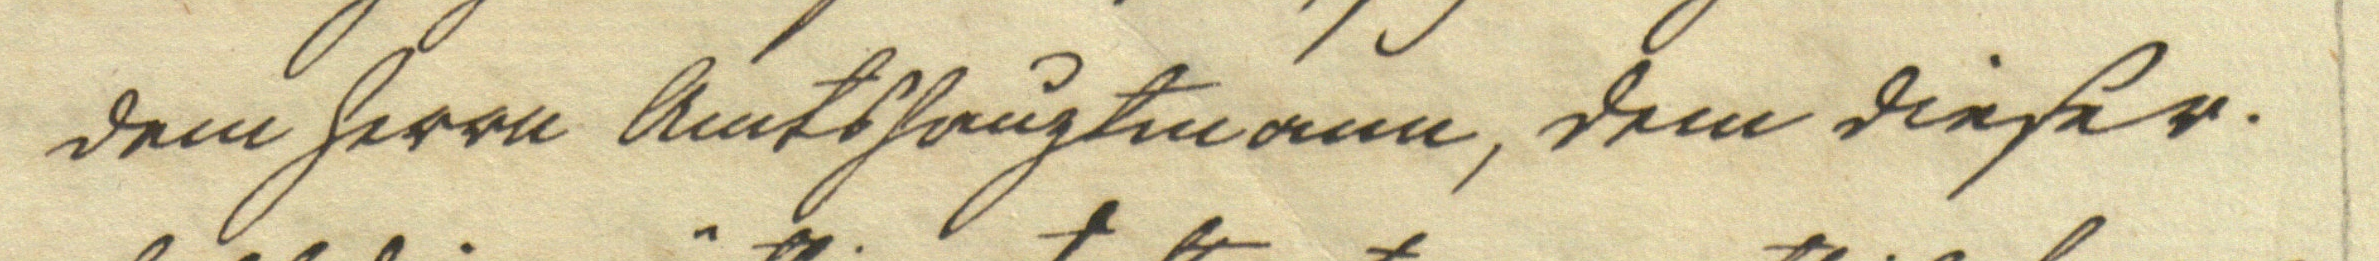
dem Herrn Amtshauptmann, dem dieser¬
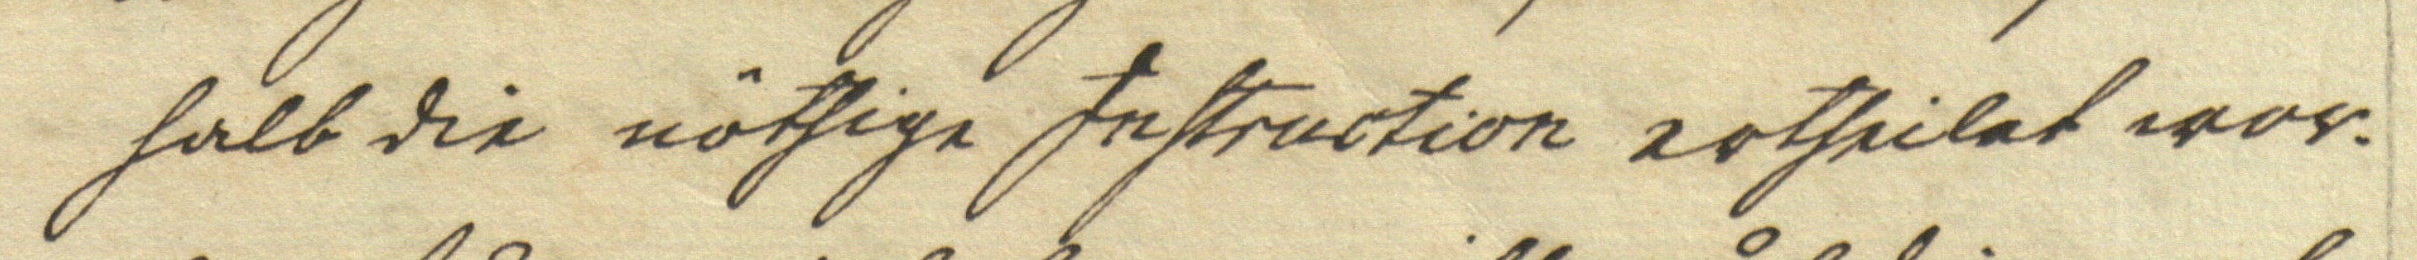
halb die nöthige Instruction ertheilet wor¬
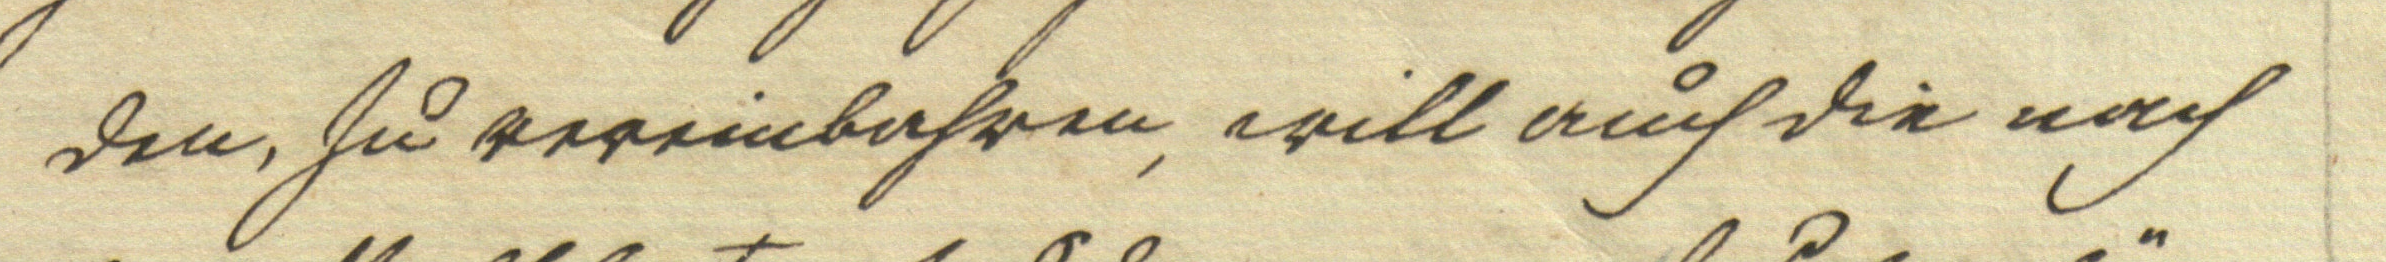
den, zu vereinbahren, will auch die nach
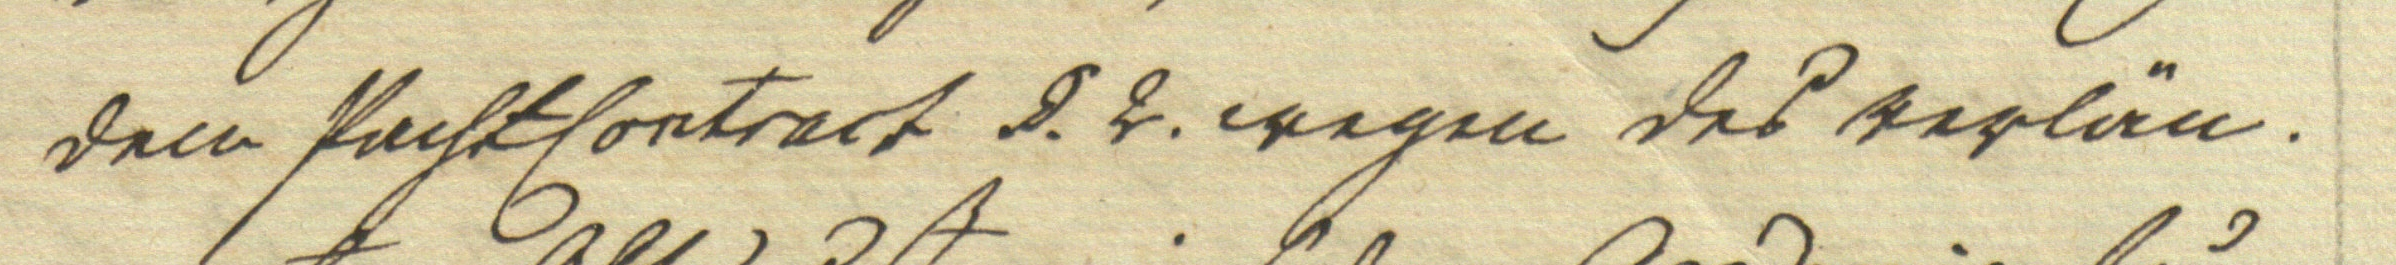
dem PachtContract §. 2. wegen des verlän¬
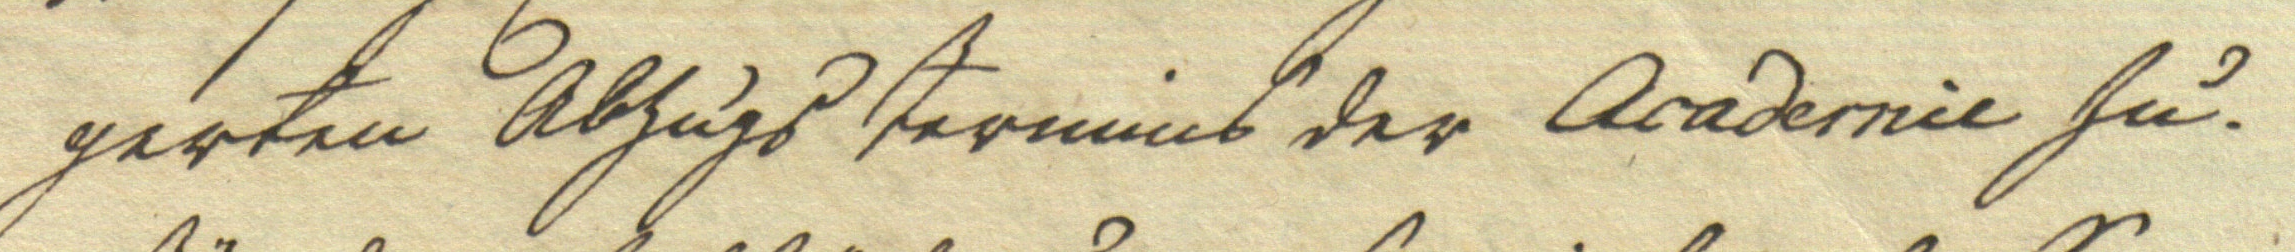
gerten Abzugs Termins der Academie zu¬
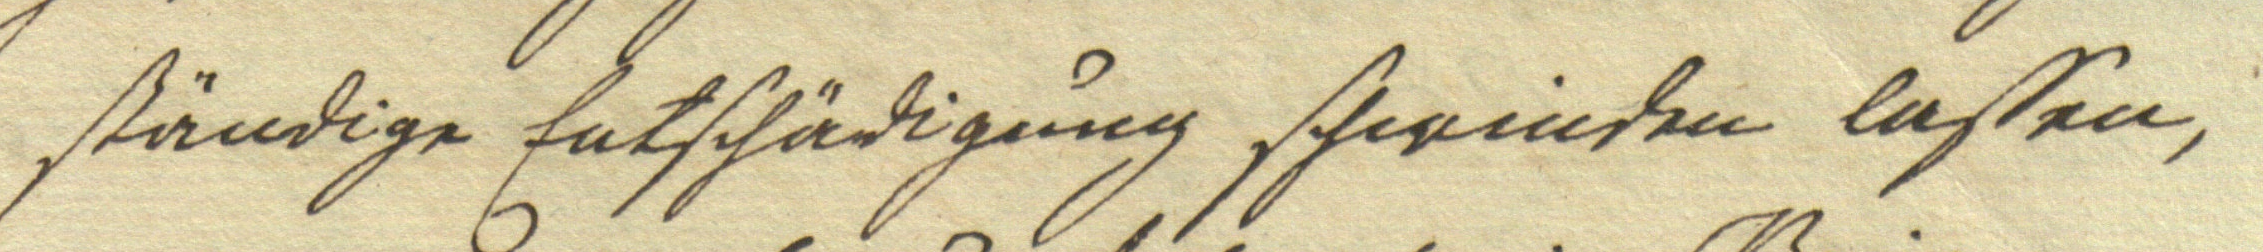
ständige Entschädigung schwinden lassen,
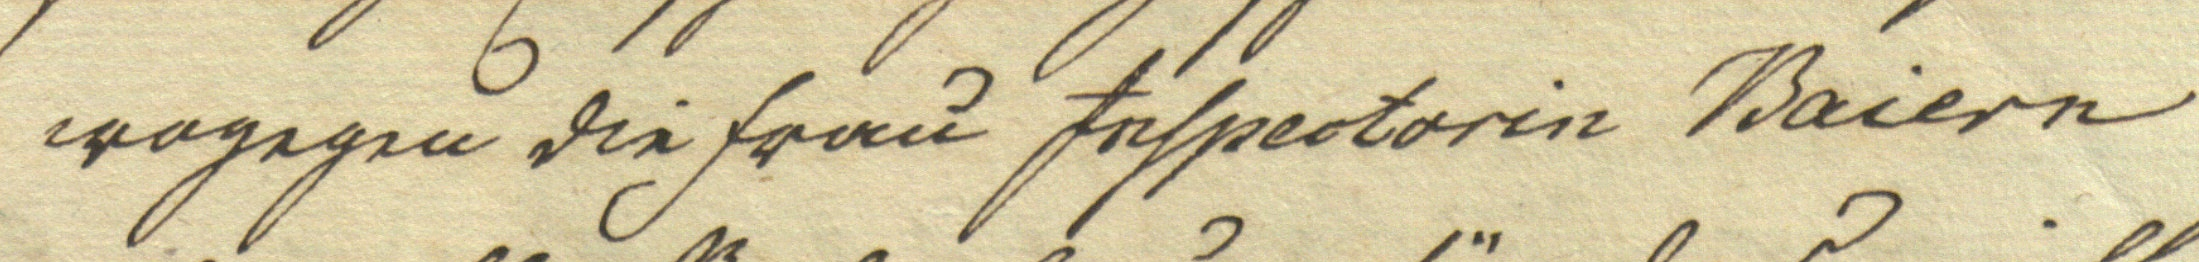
wogegen die Frau Inspectorin Baiern
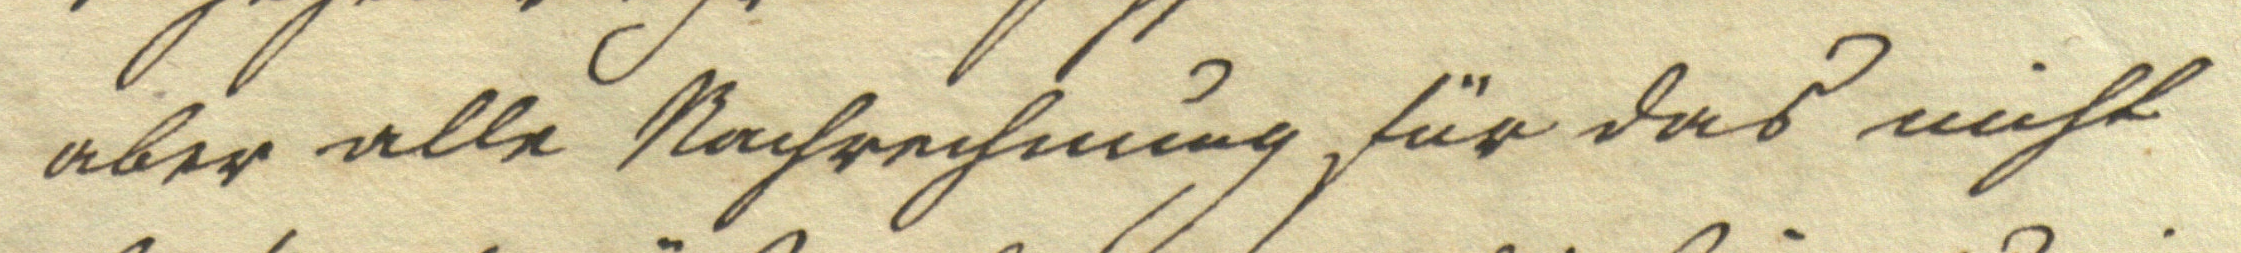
aber alle Nachrechnung für das nicht
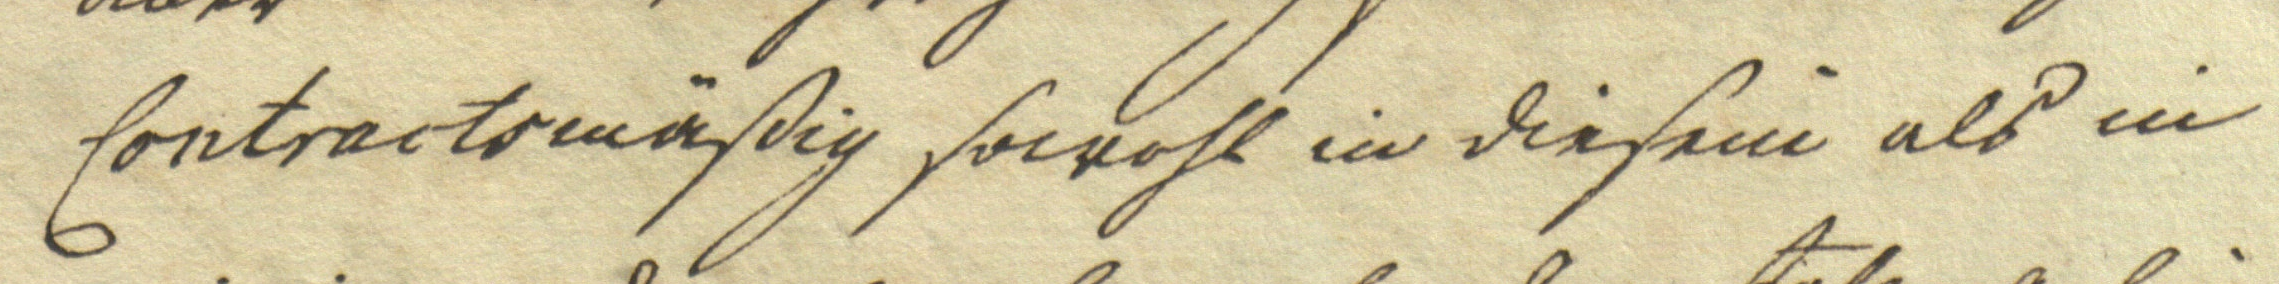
Contractsmäßig sowohl in diesem als in
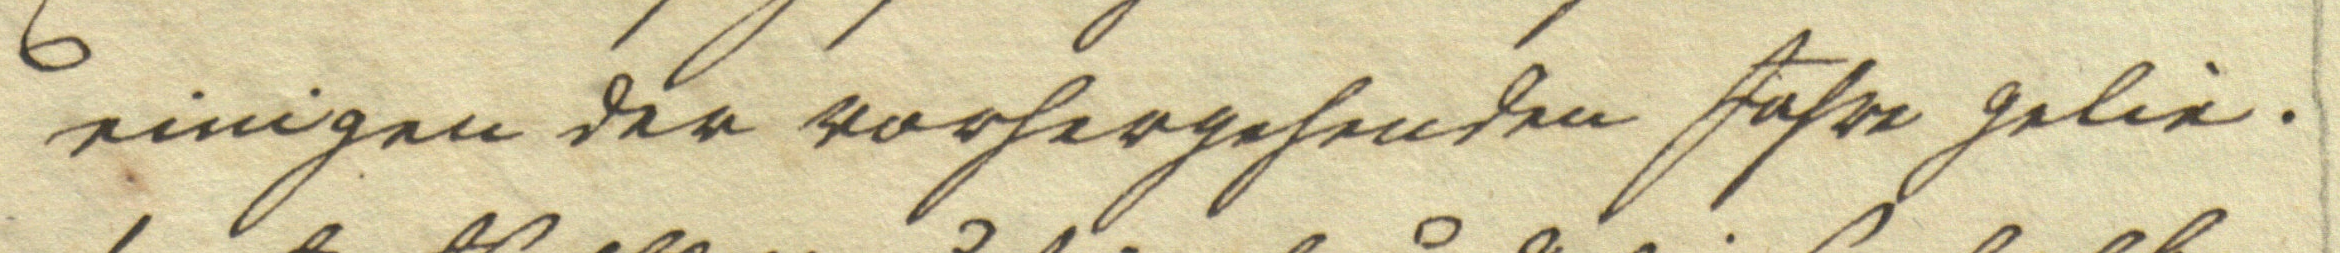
einigen der vorhergehenden Jahre gelie¬
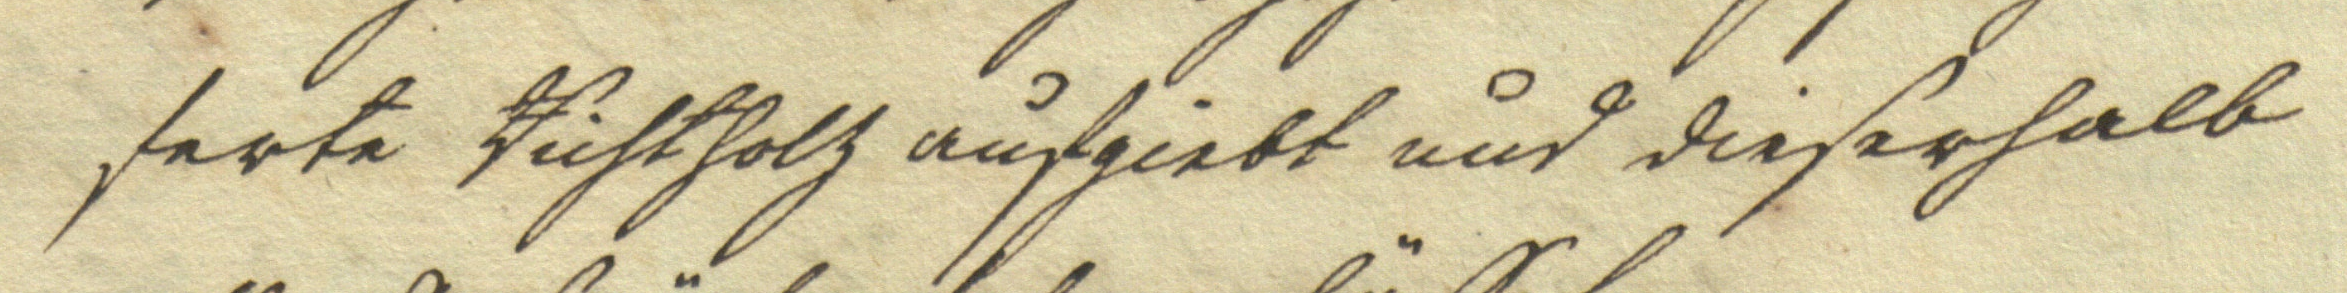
ferte Richtholz aufgiebt und dieserhalb
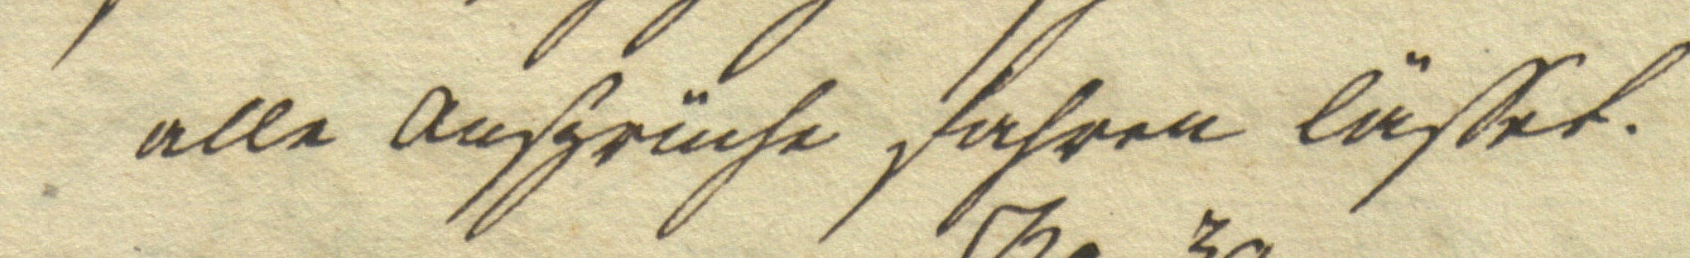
alle Ansprüche fahren lässet.
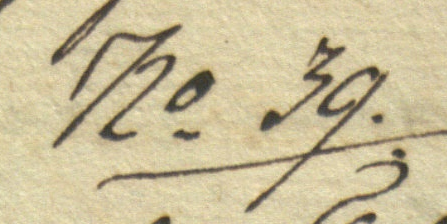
No 39.
